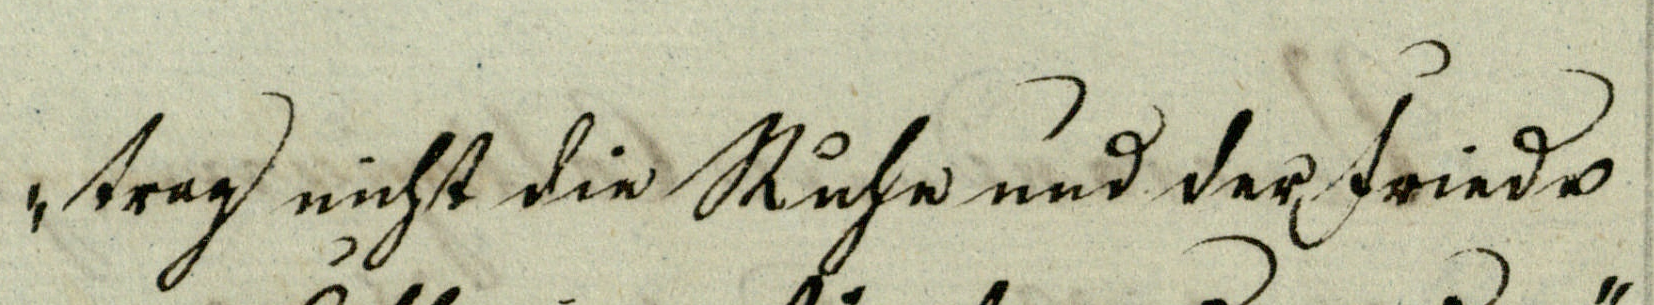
"trag nicht die Ruhe und der Friede
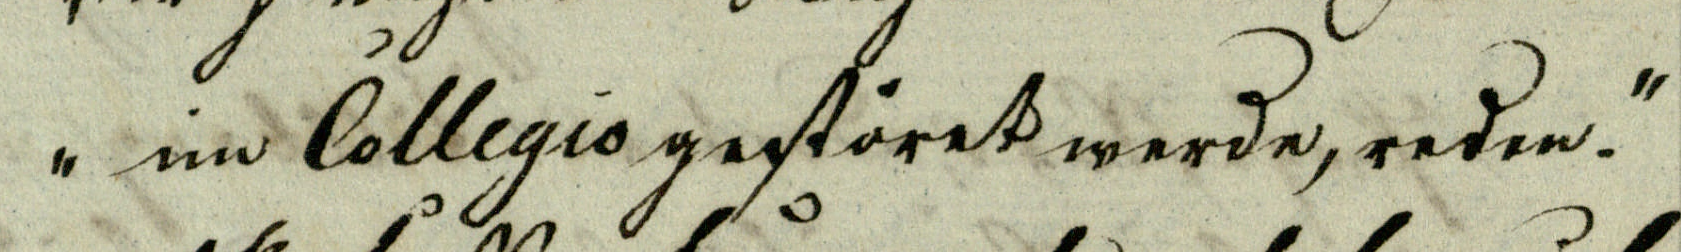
"im Collegio gestöret werde, reden."
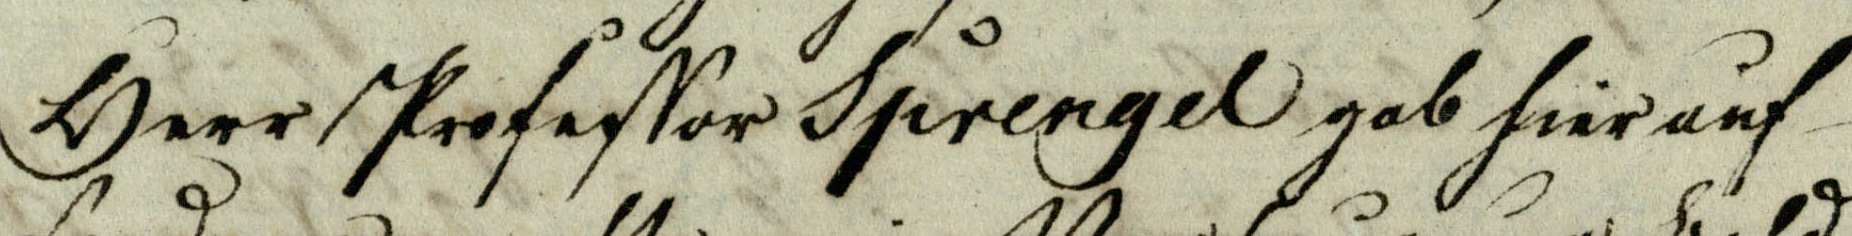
Herr Professor Sprengel gab hierauf
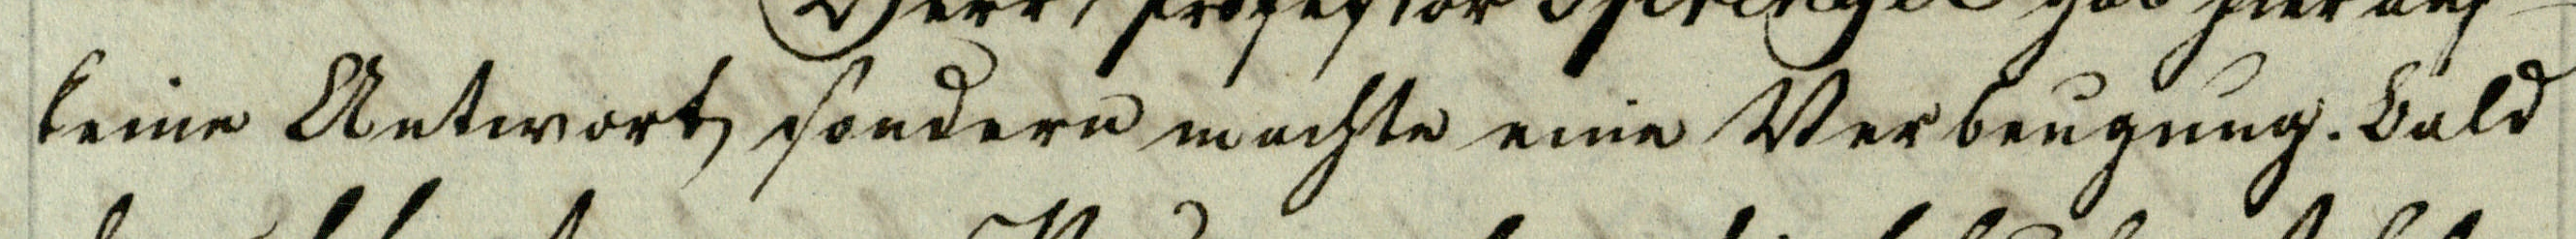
keine Antwort, sondern machte eine Verbeugung. Bald
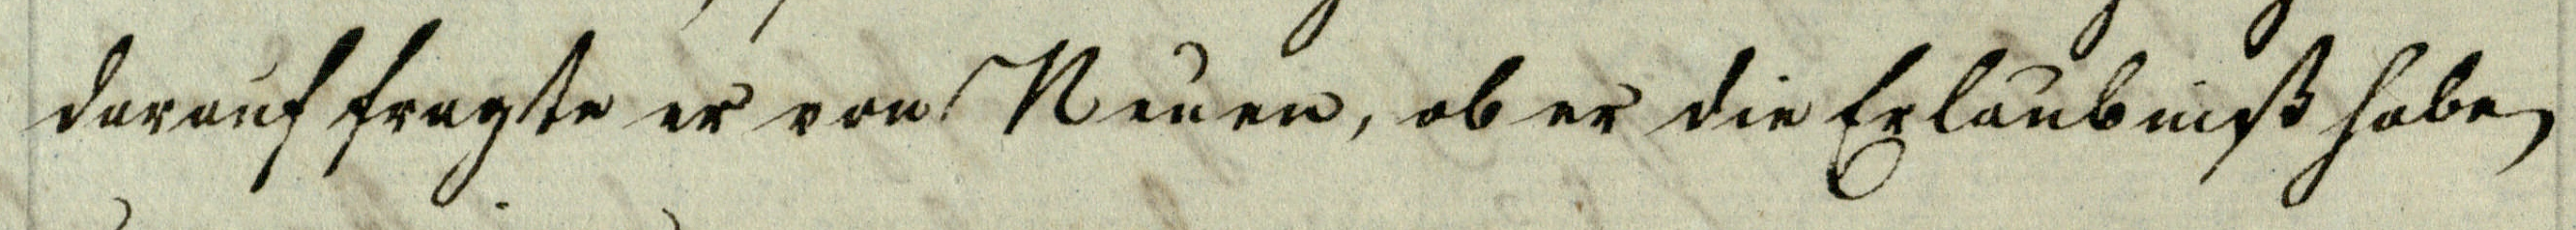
darauf fragte er von Neuen, ob er die Erlaubniß habe,
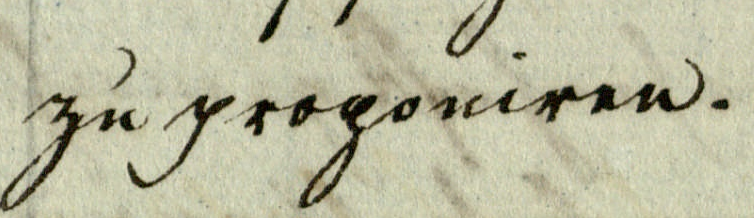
zu proponiren.
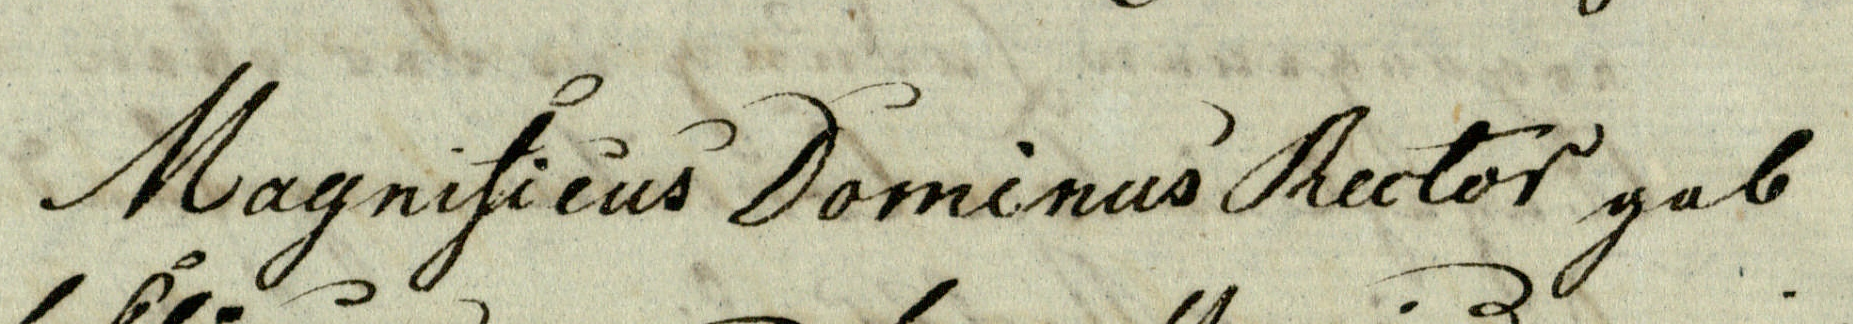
Magnificus Dominus Rector gab
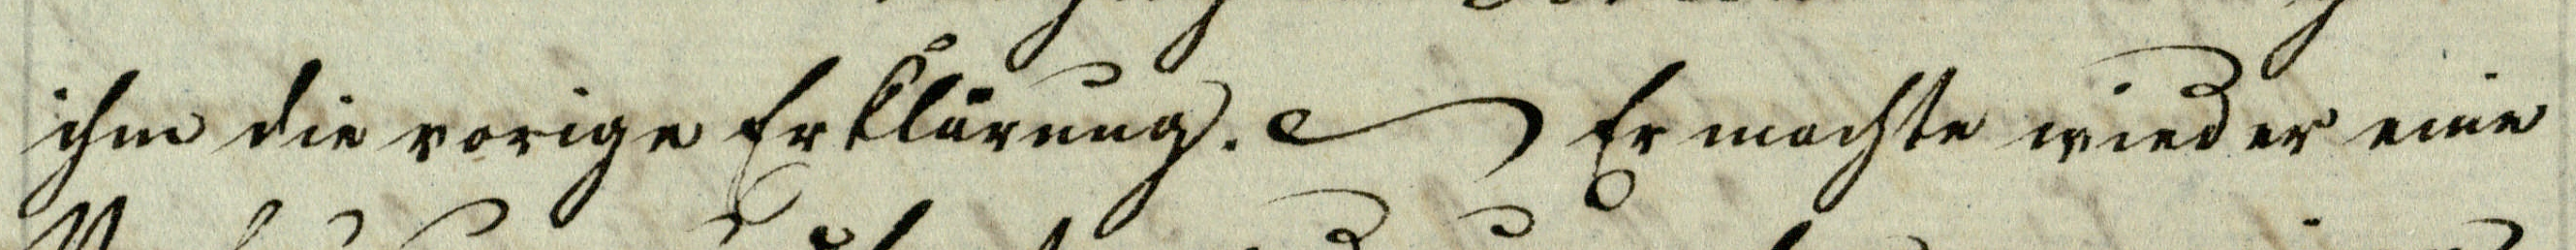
ihm die vorige Erklärung. Er machte wieder eine
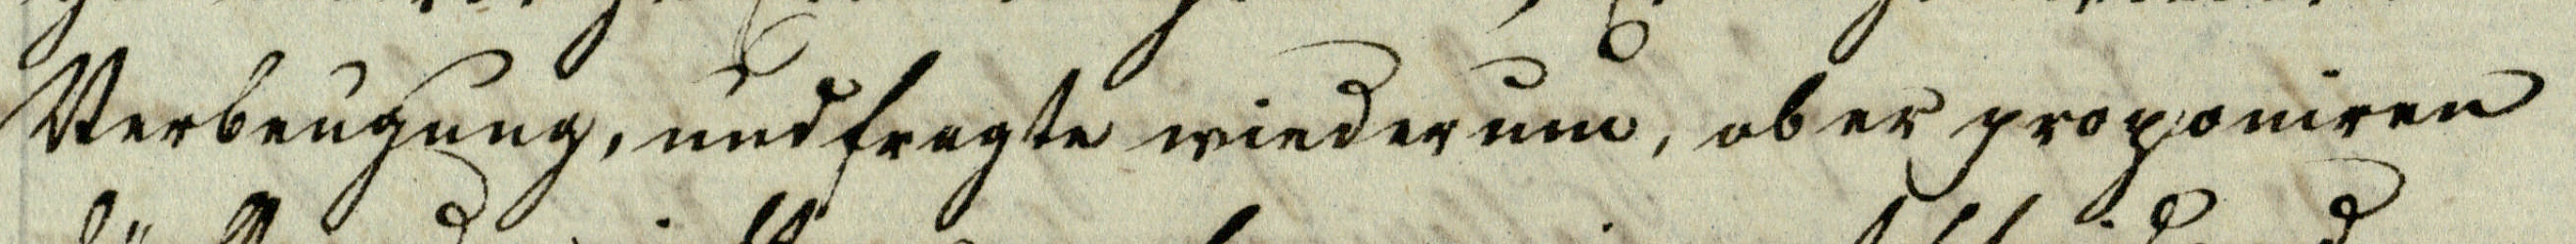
Verbeugung, und fragte wiederum, ob er proponiren
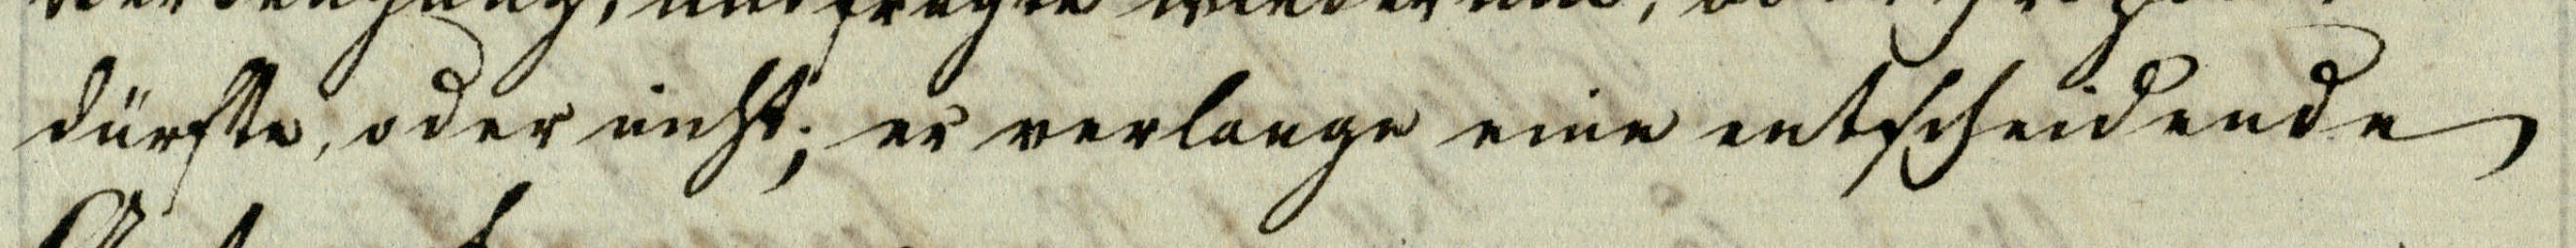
dürfte, oder nicht, er verlange eine entscheidende
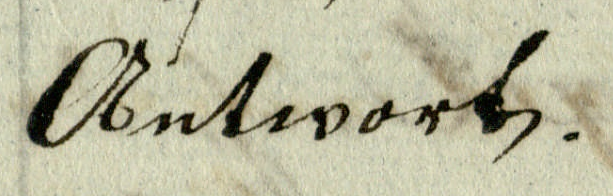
Antwort.
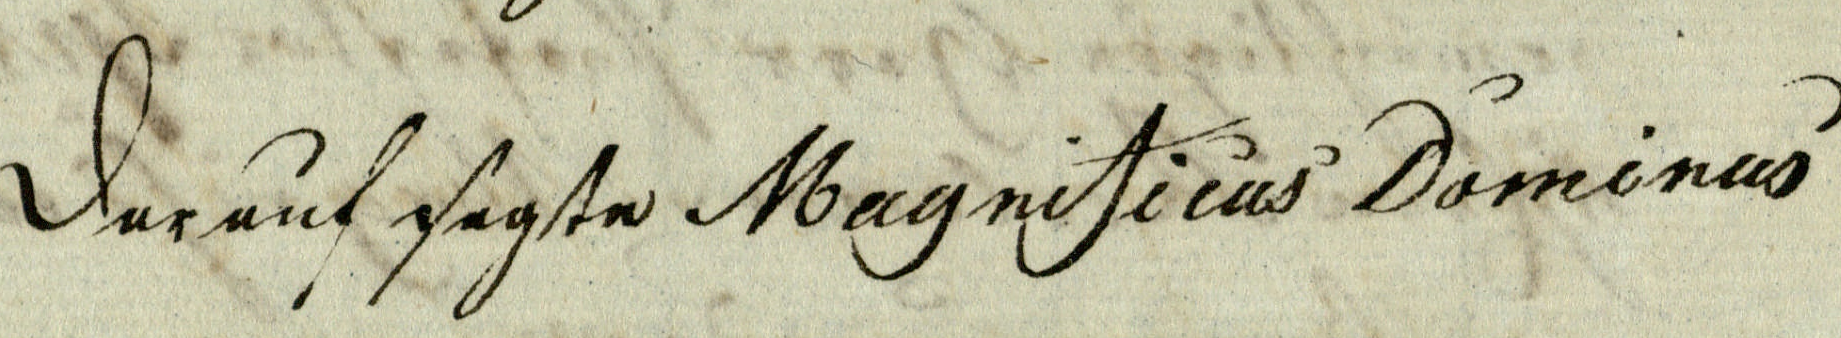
Darauf sagte Magnificus Dominus
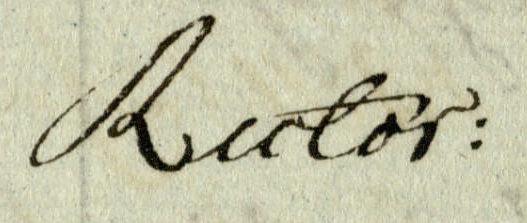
Rector:
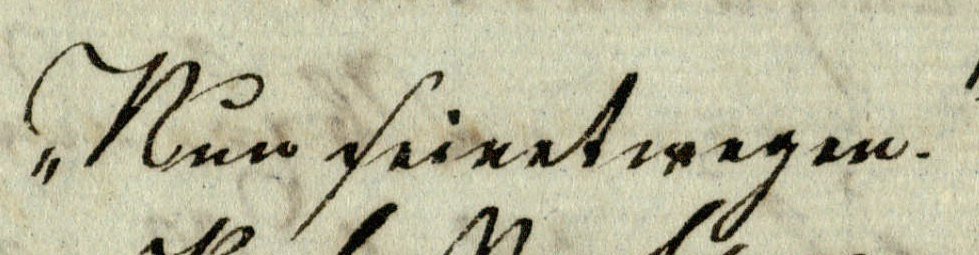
"Nun seinet wegen."
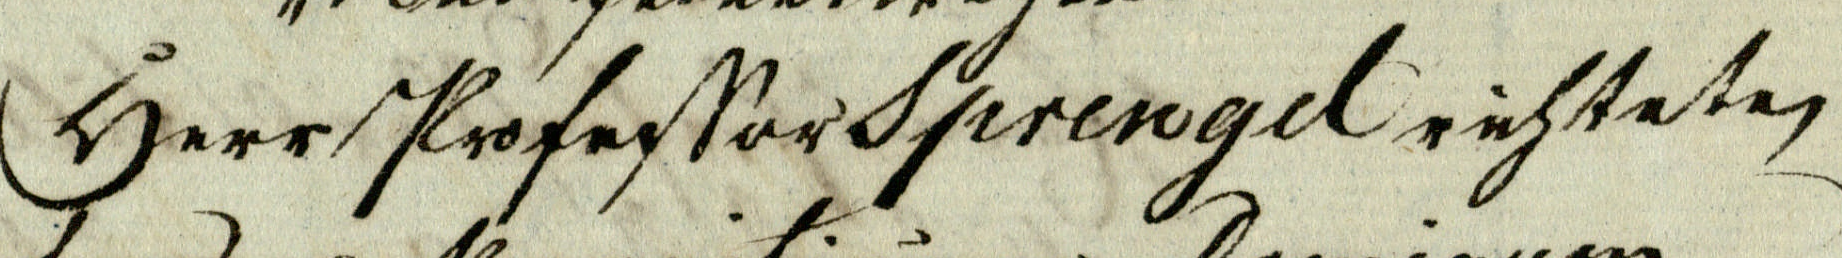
Herr Professor Sprengel richtete
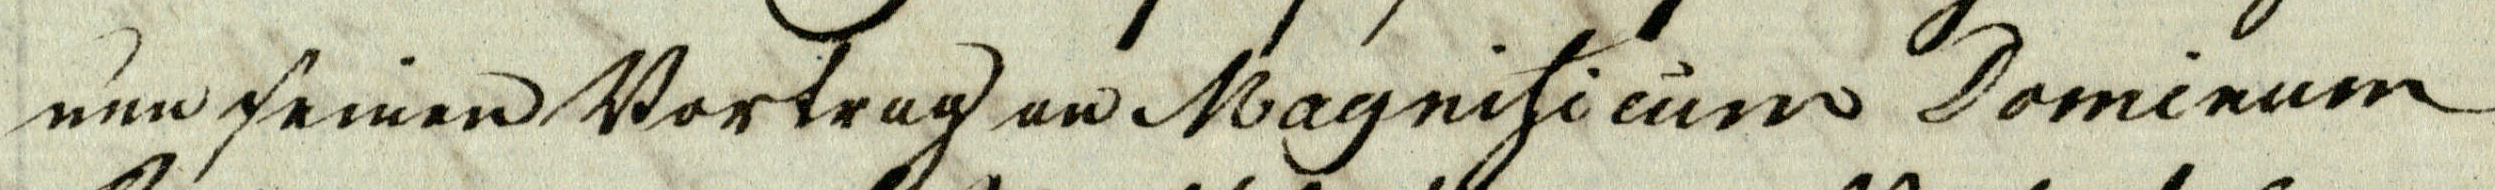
nun seinen Vortrag an Magnificum Dominum
